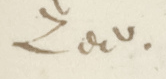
Zee.
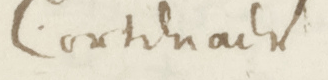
Cortenaer
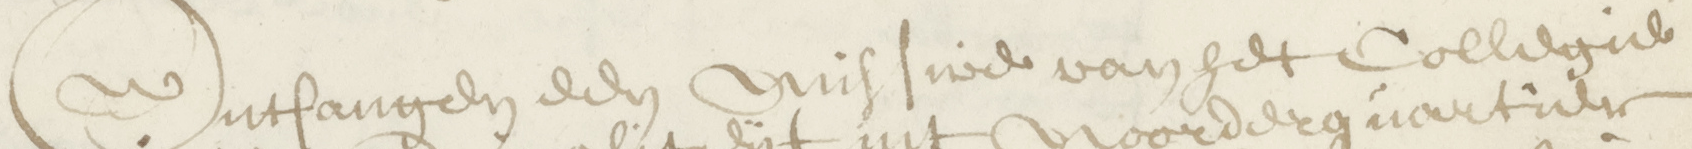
Ontfangen een missive van het Collegie
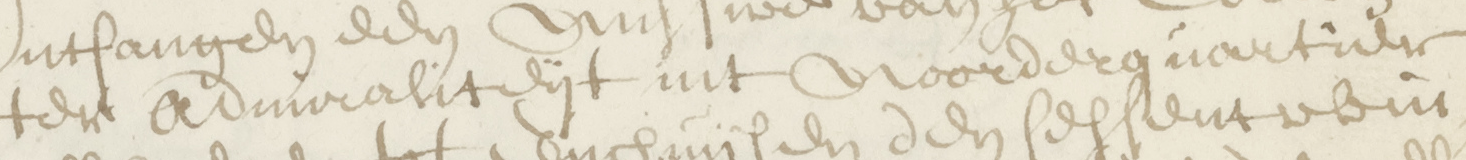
ter Admiraliteijt int Noorderquartier
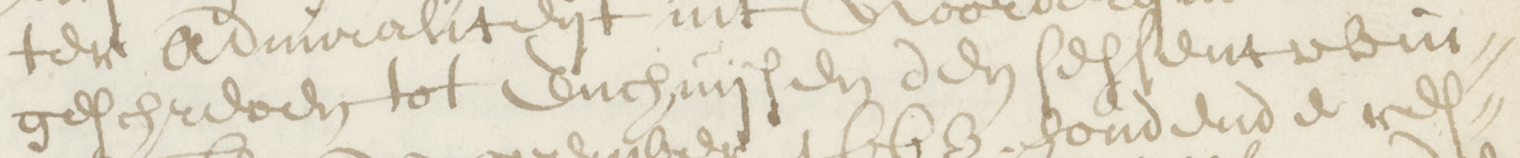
geschreven tot Enchuijsen den sessentwin„
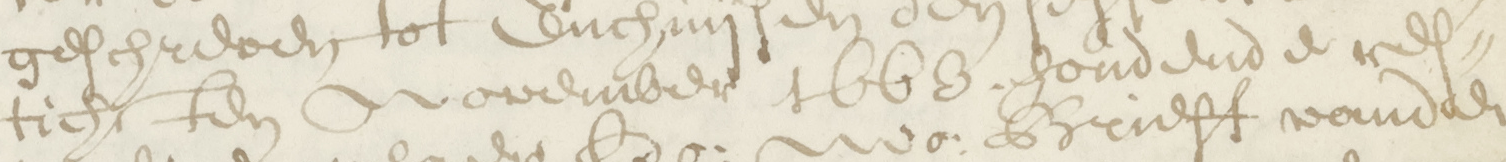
tichsten November 1663 houdende res„
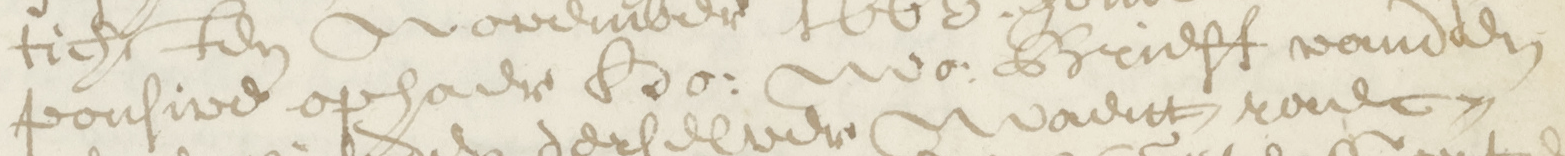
ponsive op haer Ho:Mo: Brieff vanden
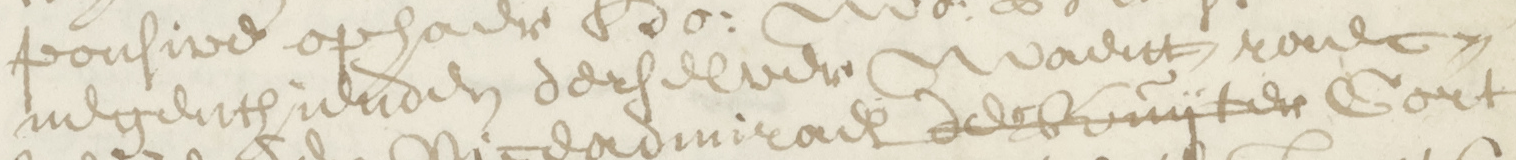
negenthienden derselver maent, raec„
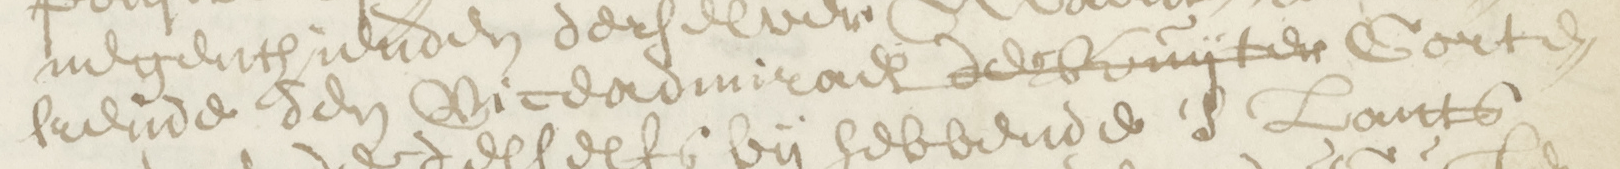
kende den Viceadmirael de Ruijter Corte,,
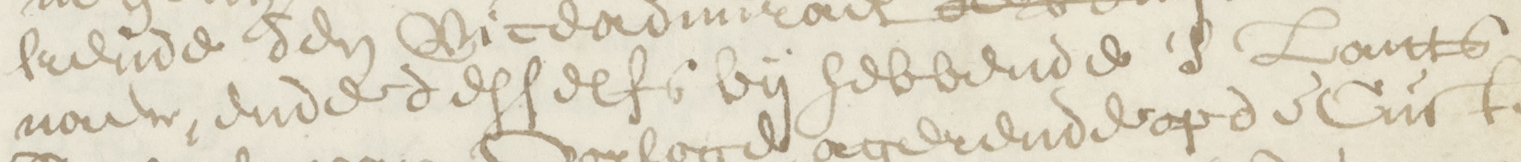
naer, ende desselfs bij hebbende ‛s Lants
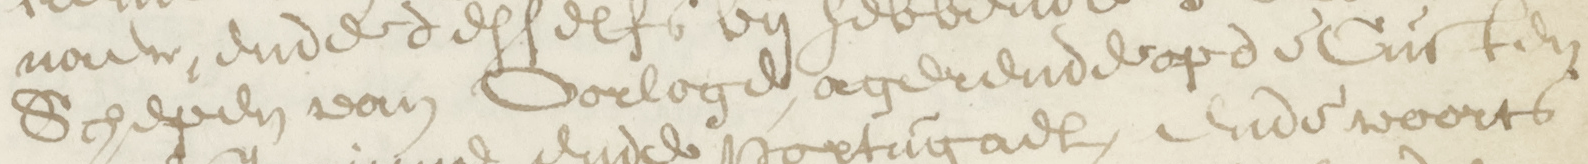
Schepen van Oorloge, agerende opde Custen
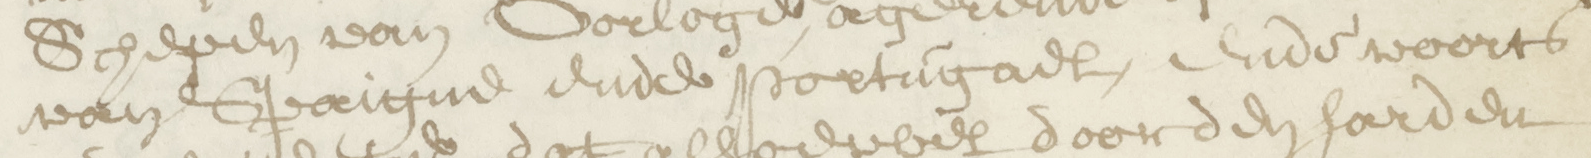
van Spaigne ende Portugael, ende voorts
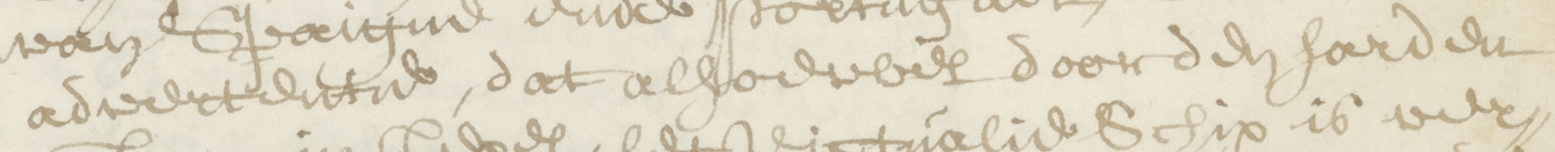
advertentie, dat alhoewel door den harden
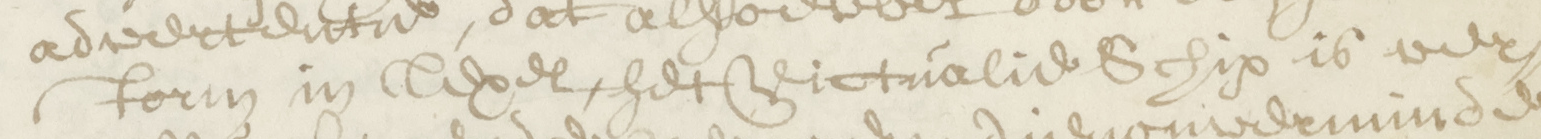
storm in Texel, het Victualie Schip is ver„
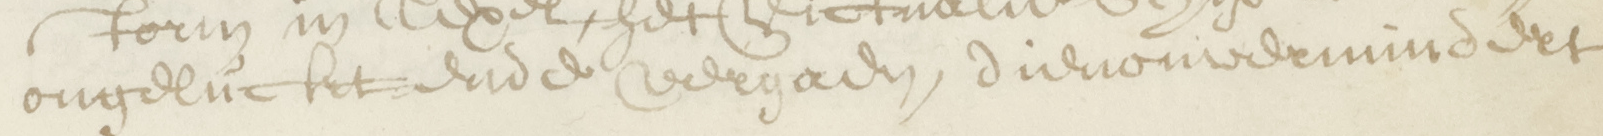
ongeluckt ende vergaen, dienonvermindert
